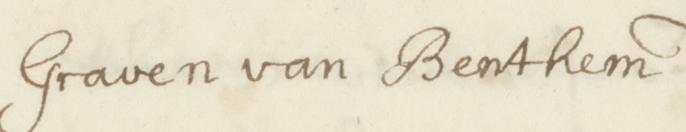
Graven van Benthem
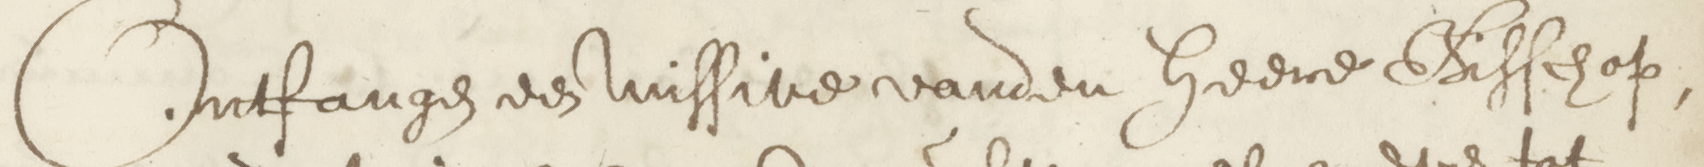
Ontfangen een missive vanden heere Bisschop,
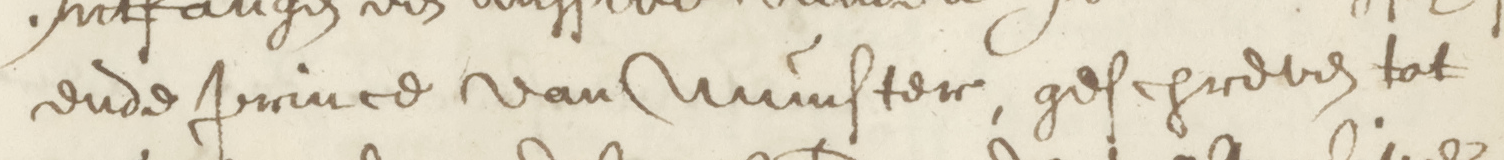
ende Prince van Munster, geschreven tot
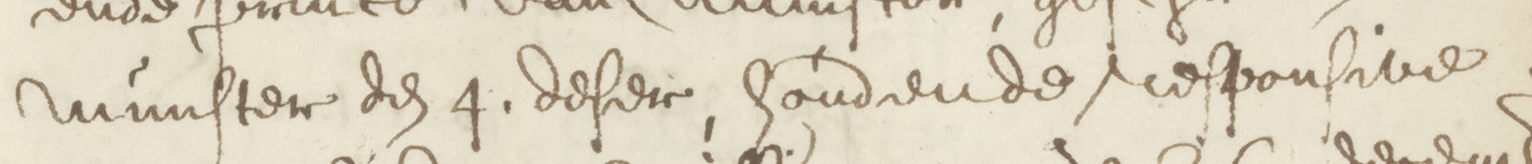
Munster den 4. deser, houdende responsive
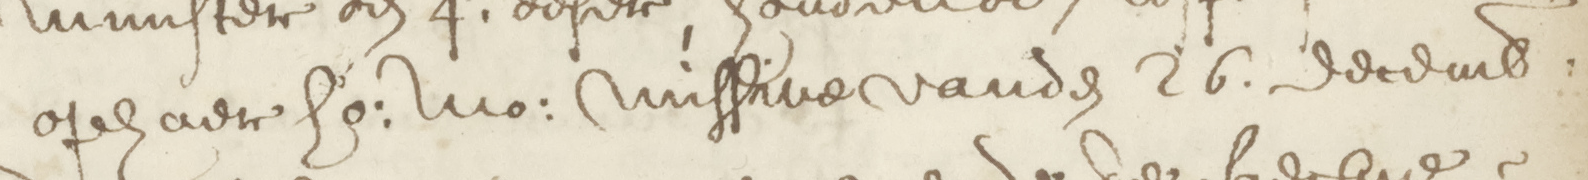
op haer Ho:Mo: missive vanden 26. Decemb.
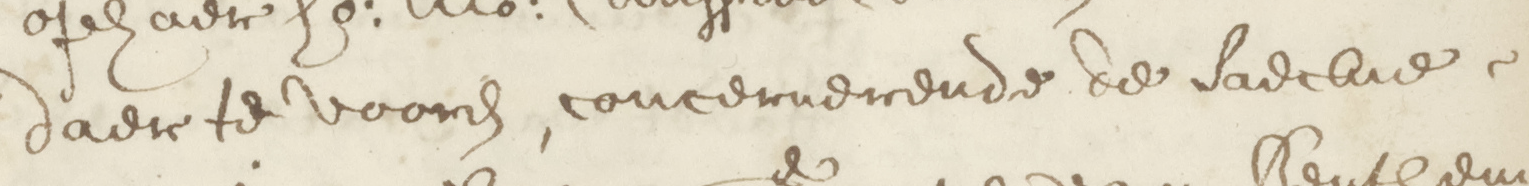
daer te vooren, concernerende de saecke
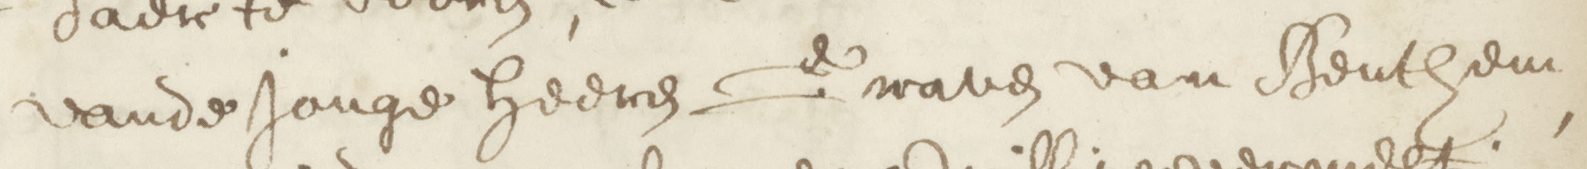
vande Jonge heeren Graven van Benthem
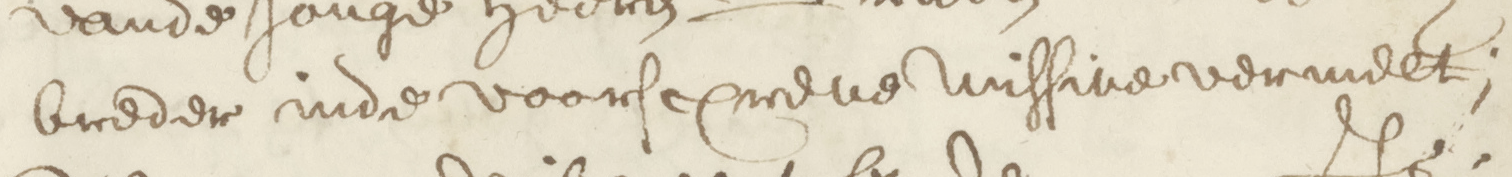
breder inde voorschreve missive vermelt:
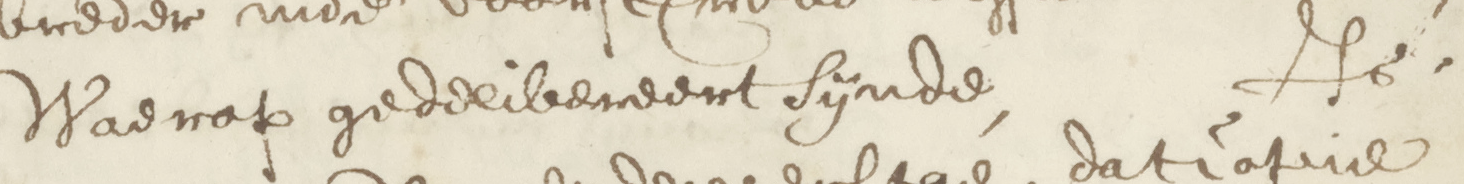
Waerop gedelibereert sijnde, Is
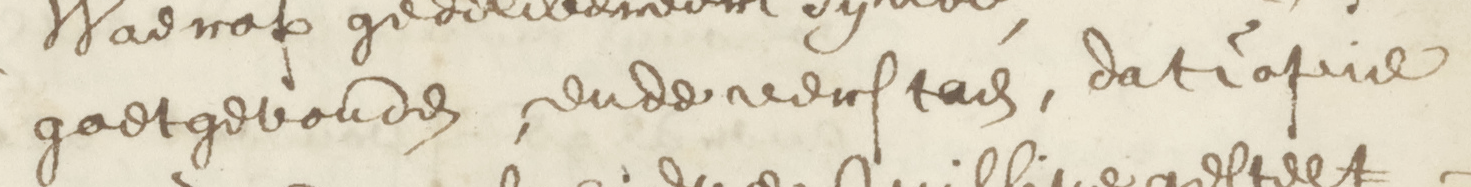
goetgevonden, ende verstaen, dat copie
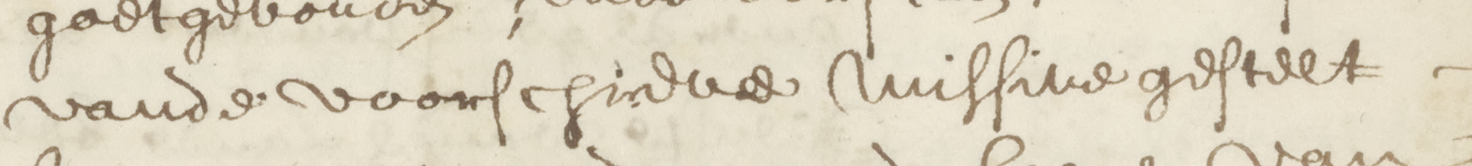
vande voorschreve missive gestelt
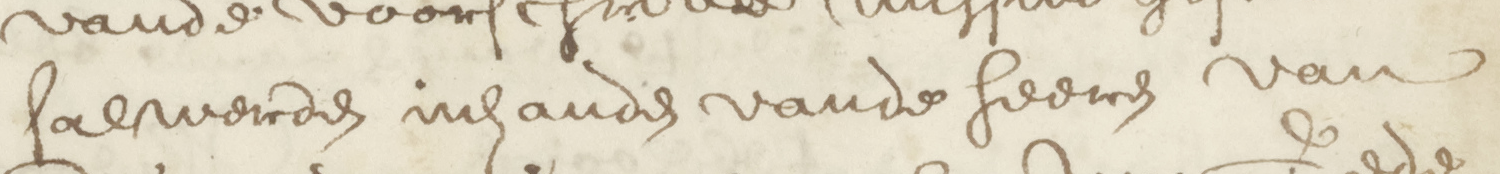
sal werden inhanden vande heeren van
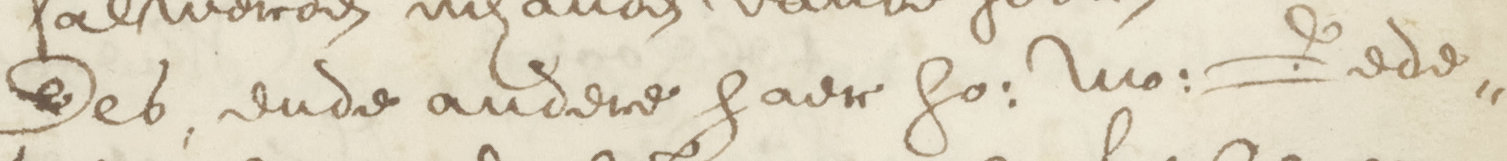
Els, ende andere haer Ho:Mo: Gede„
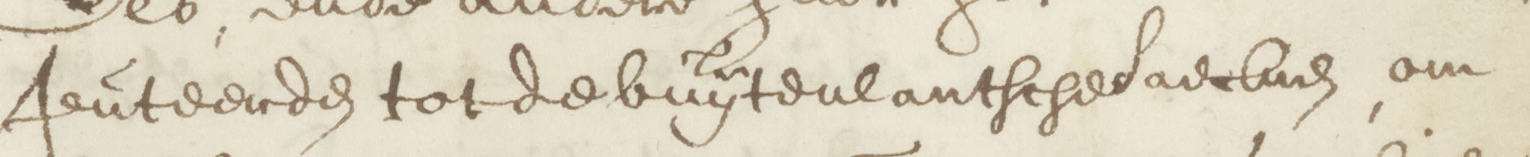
puteerden tot de buijtenlantsche saecken om
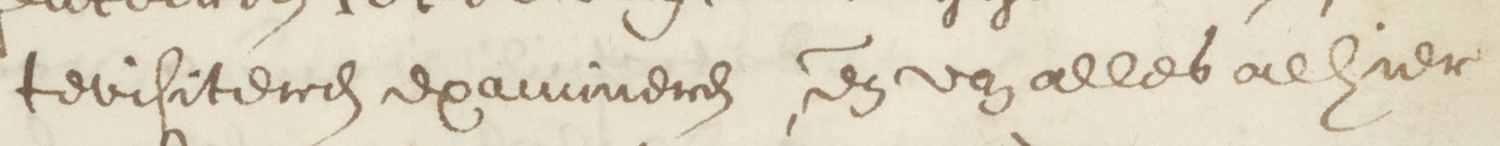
te visiteren examineren, en van alles alhier
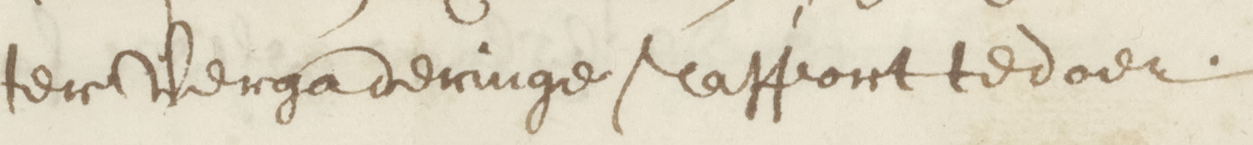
ter Vergaderinge rapport te doen.
